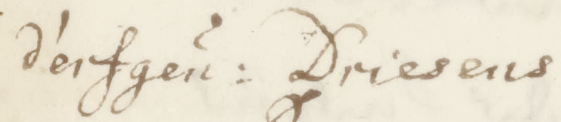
d‛erfgen.: Driesens
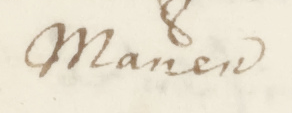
Manen
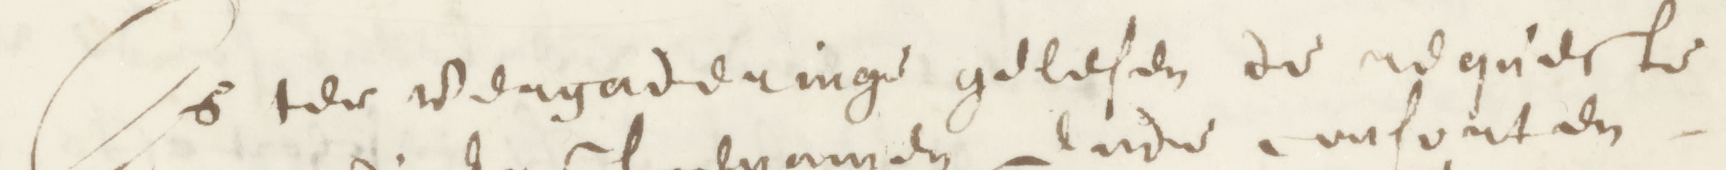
Is ter vergaderinge gelesen de requeste
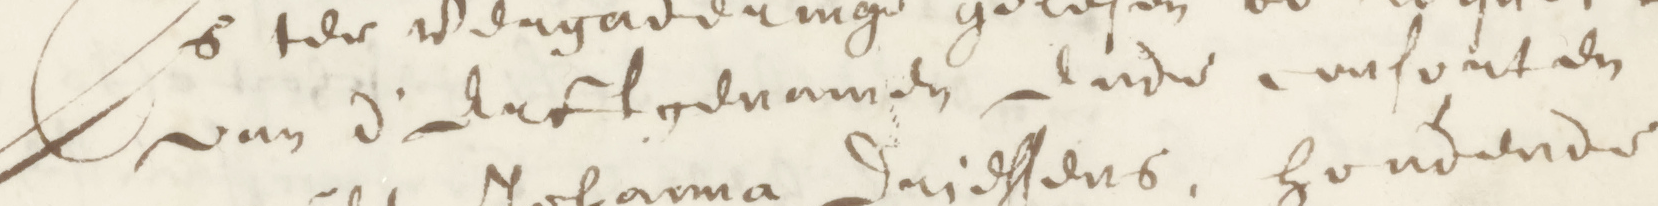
van d‛Erffgenamen Ende consorten
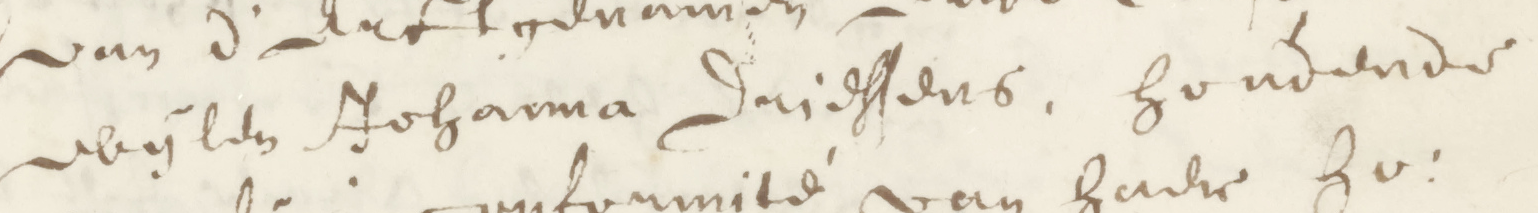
wijlen Johanna Driessens, houdende
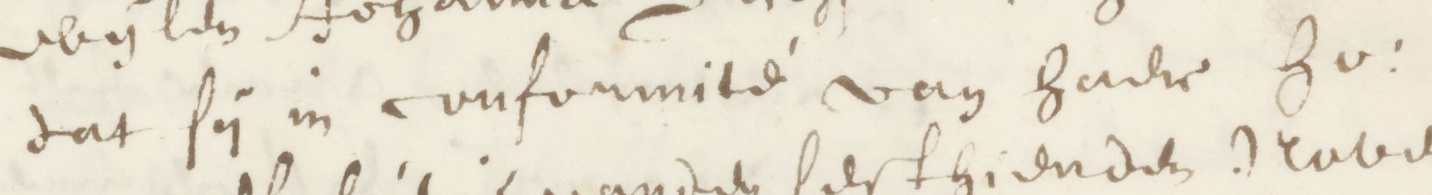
dat sij in conformité van haer ho:
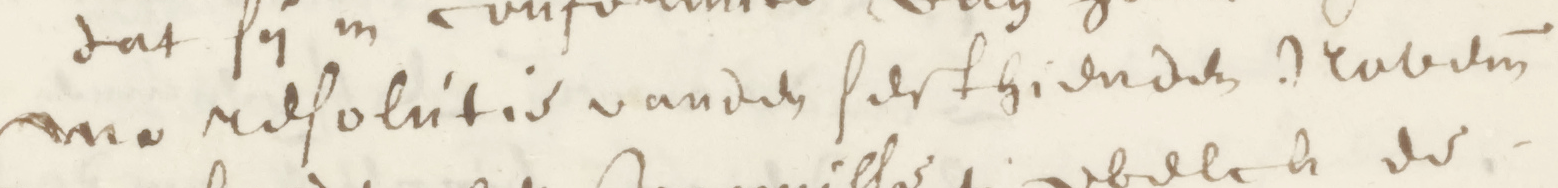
Mo: resolutie vanden sesthienden Novem.
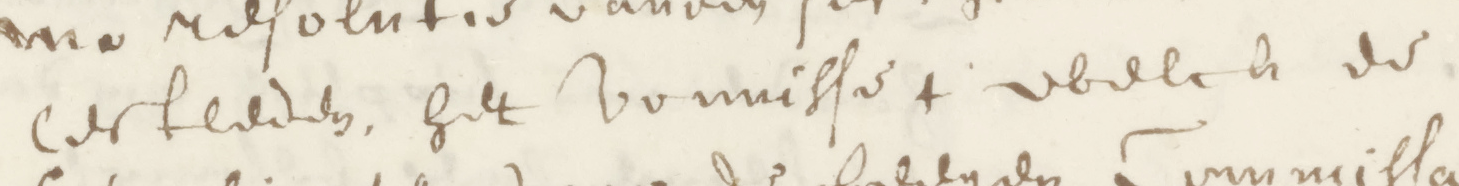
lestleden, het vonnisse t welck de
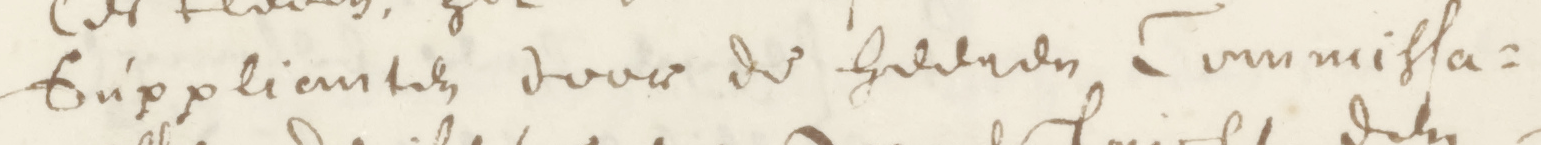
Supplianten door de heeren Commissa„
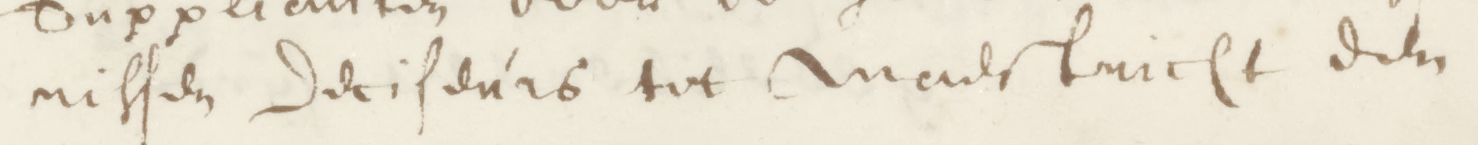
rissen Deciseurs tot Maestricht den
